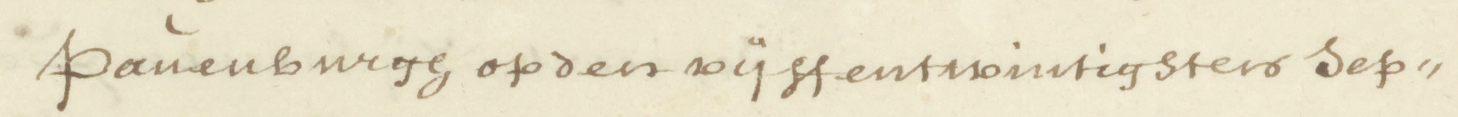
Pauenburgh op den vijffentwintigsten sep„
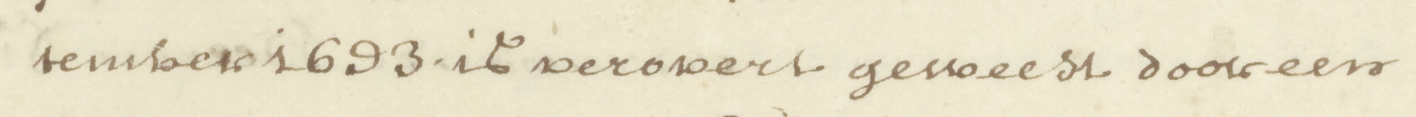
tember 1693 is verovert geweest door een
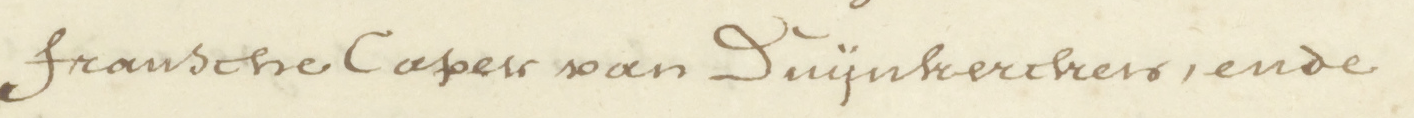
fransche Caper van Duijnkercken, ende
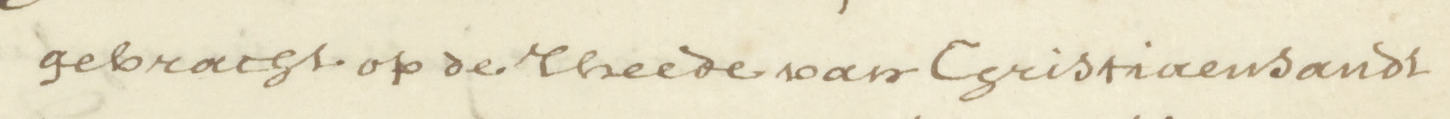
gebracht op de rheede van Christiaensandt
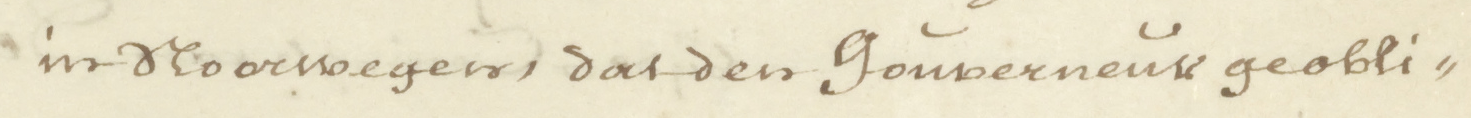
in Noorwegen, dat den Gouverneur geobli„
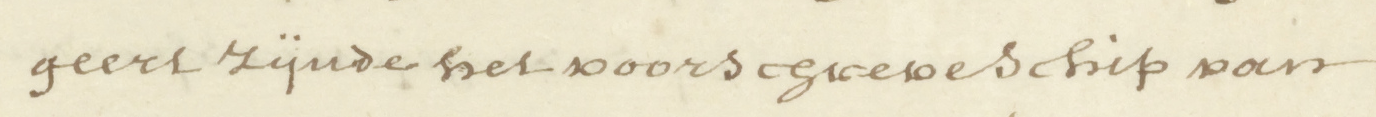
geert zijnde het voorschreve schip van
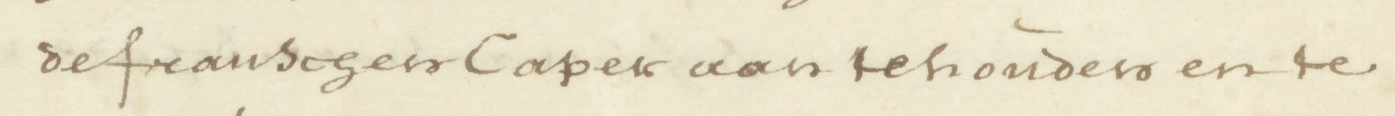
de franschen Caper aan te houden en te
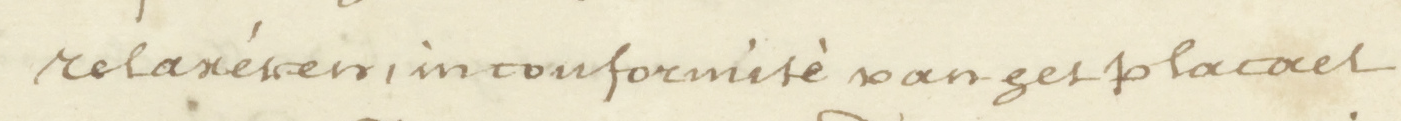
relaxeren, in conformité van het placaet
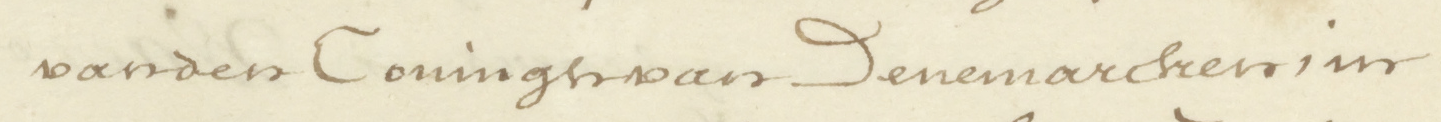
vanden Coningh van Denemarcken, in
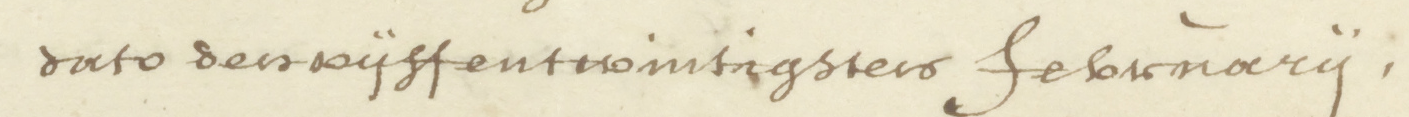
dato den vijffentwintigsten februarij.
